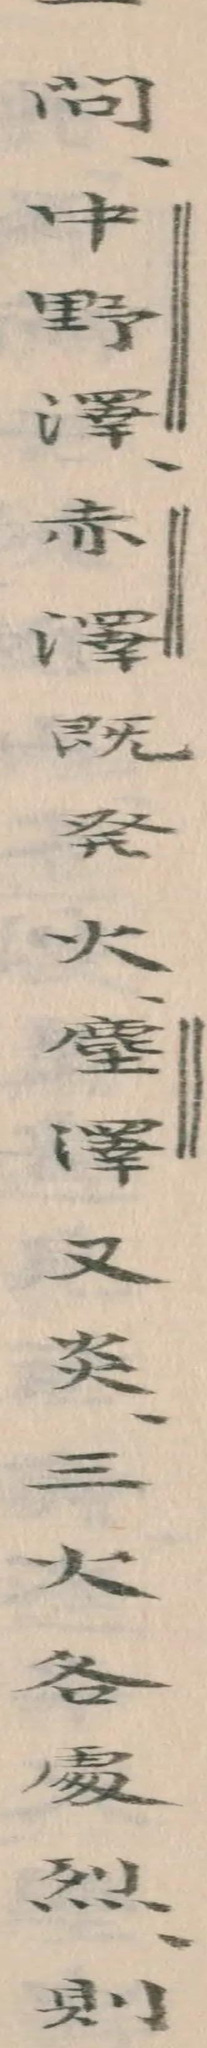一問、中野沢、赤沢既発火、塵沢又炎、三火各処烈、則
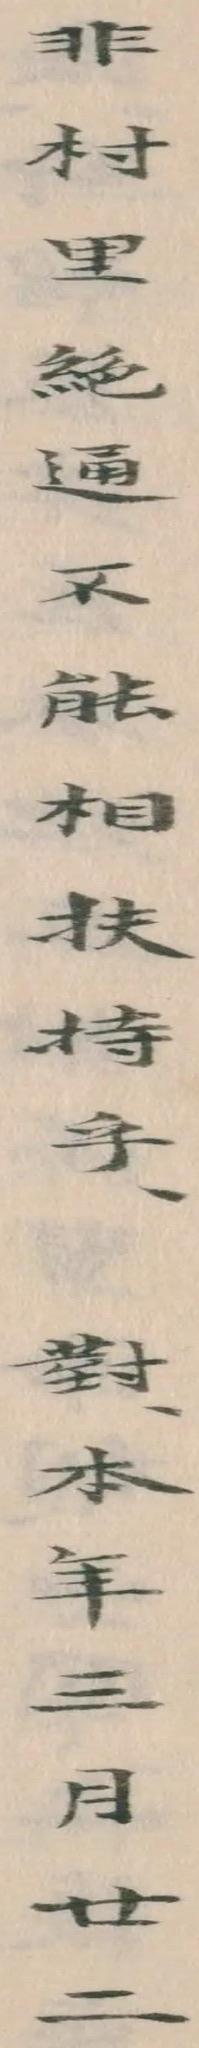非村里絶通不能相扶持乎、対、本年三月廿二
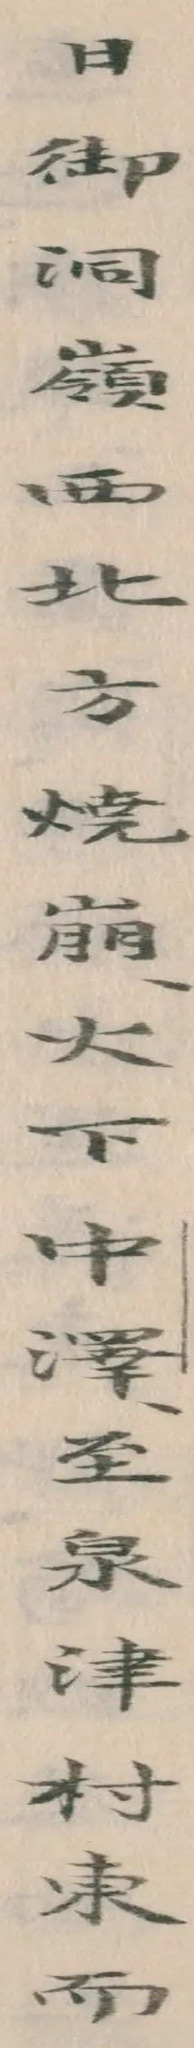日御洞嶺西北方焼崩、火下中沢、至泉津村東而
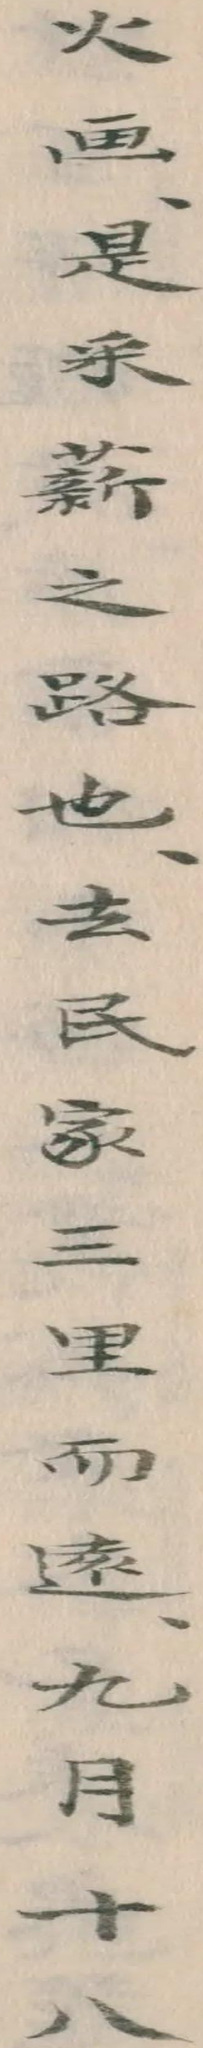火画、是采薪之路也、去民家三里而遠、九月十八
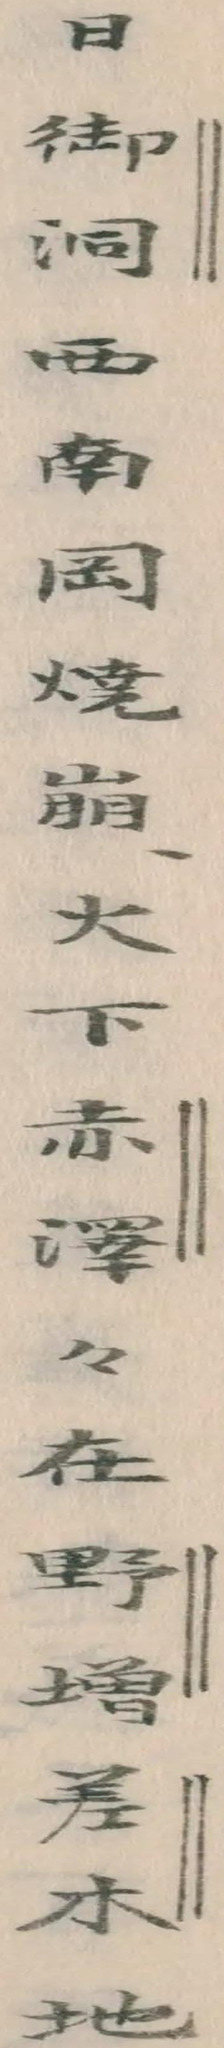日御洞西南岡焼崩、火下赤沢々在野増差木地
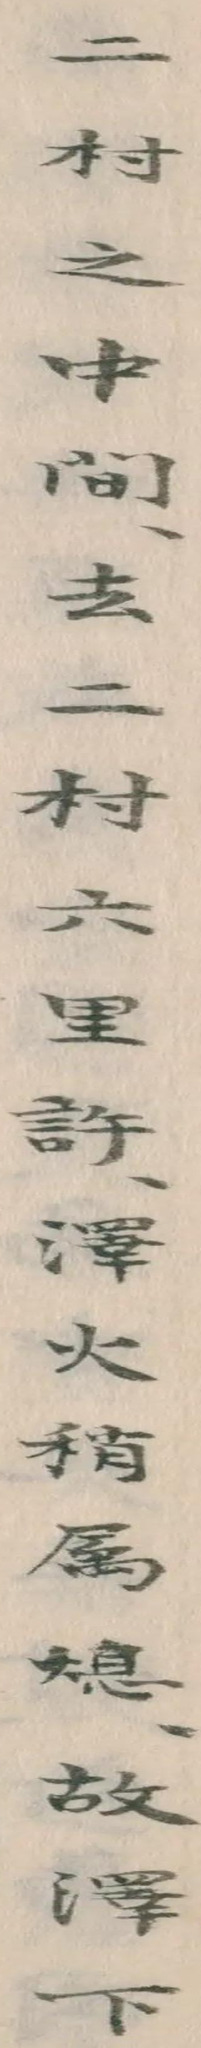二村之中間、去二村六里許、沢火稍属熄、故沢下
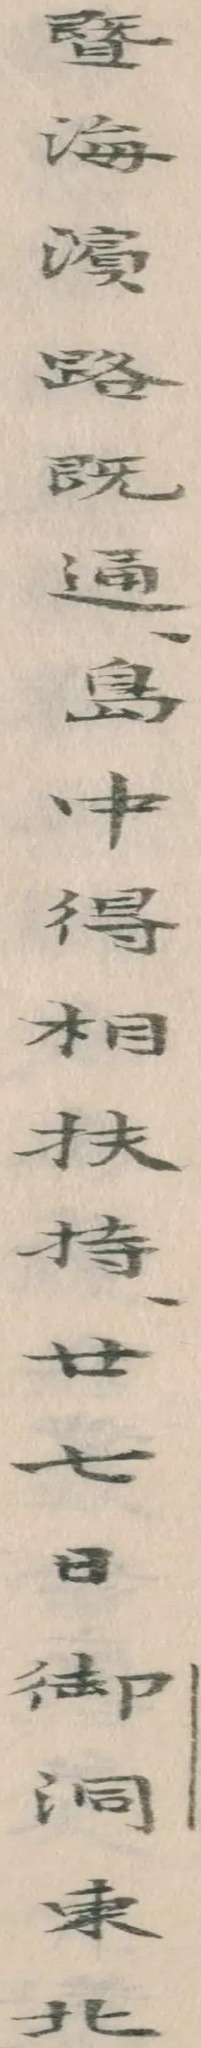曁海浜路既通、島中得相扶持、廿七日御洞東北
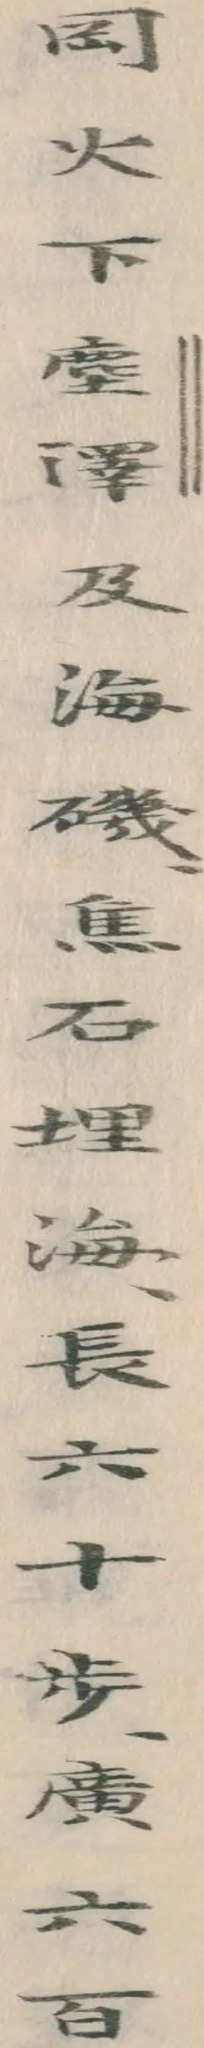岡火下塵沢及海磯、焦石埋海、長六十歩、広六百
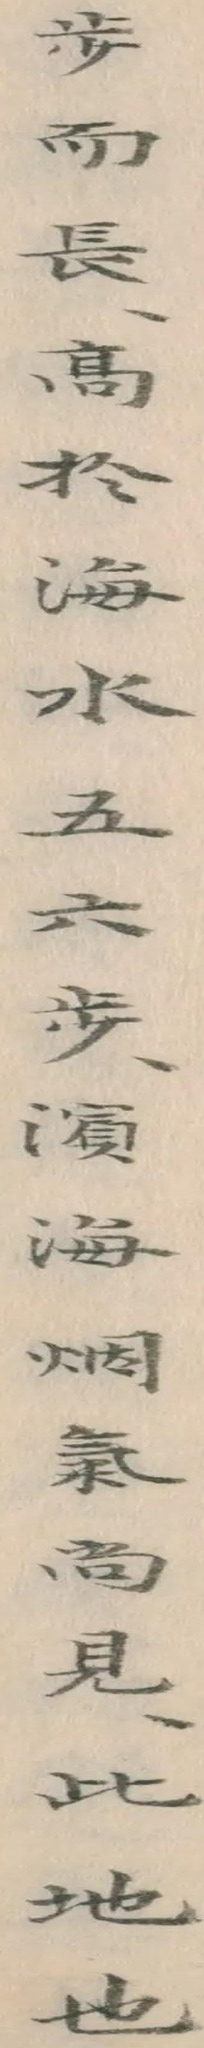歩而長、高於海水五六歩、浜海烟気尚見、此地也

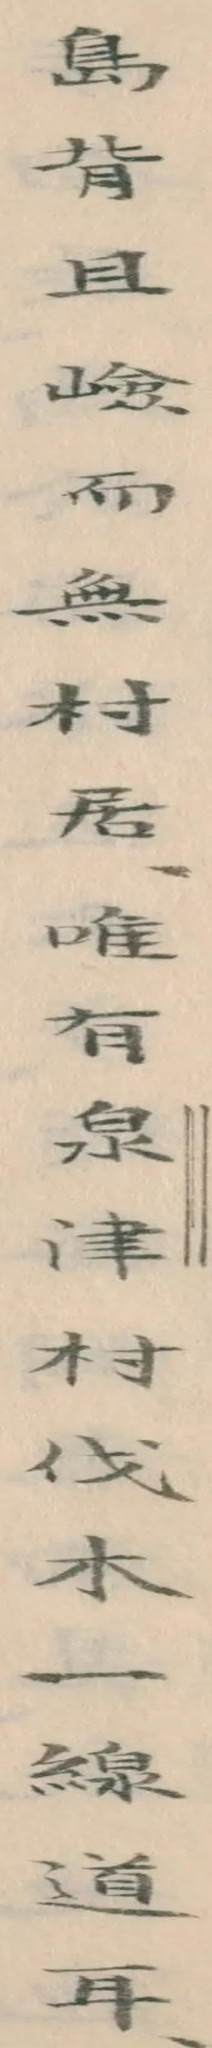島背且嶮而無村居、唯有泉津村伐木一線道耳、
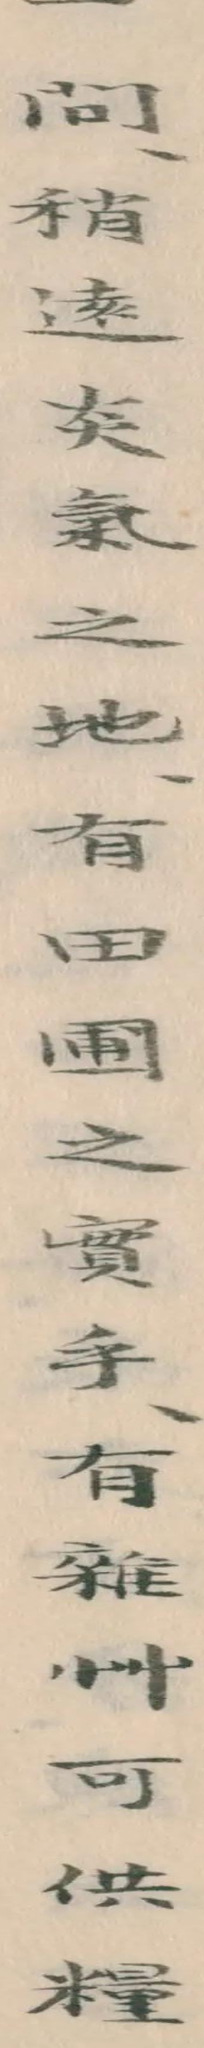一問、稍遠炎気之地、有田圃之実乎、有雑艸可供糧
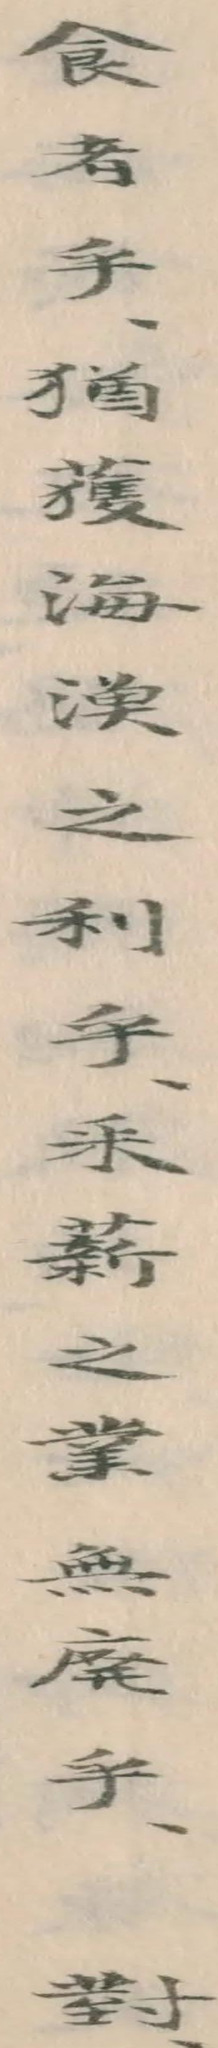食者乎、猶獲海漁之利乎、采薪之業無廃乎、対、
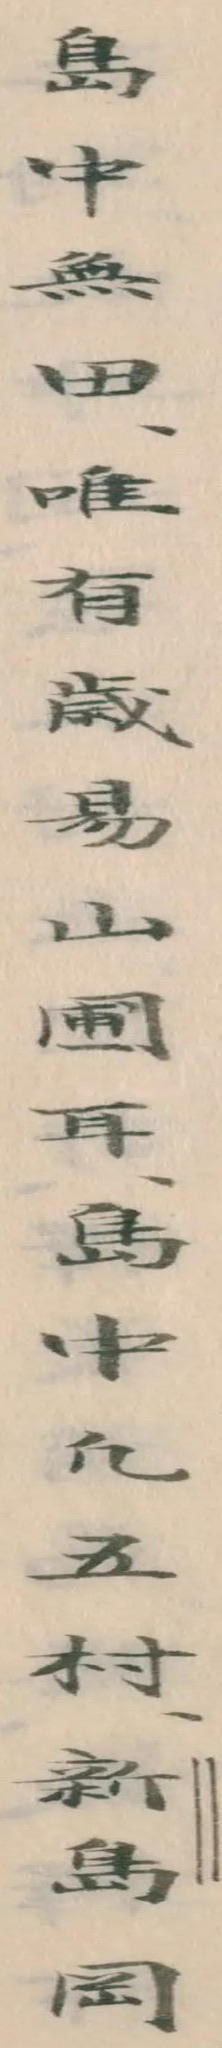島中無田、唯有歳易山圃耳、島中凡五村、新島岡
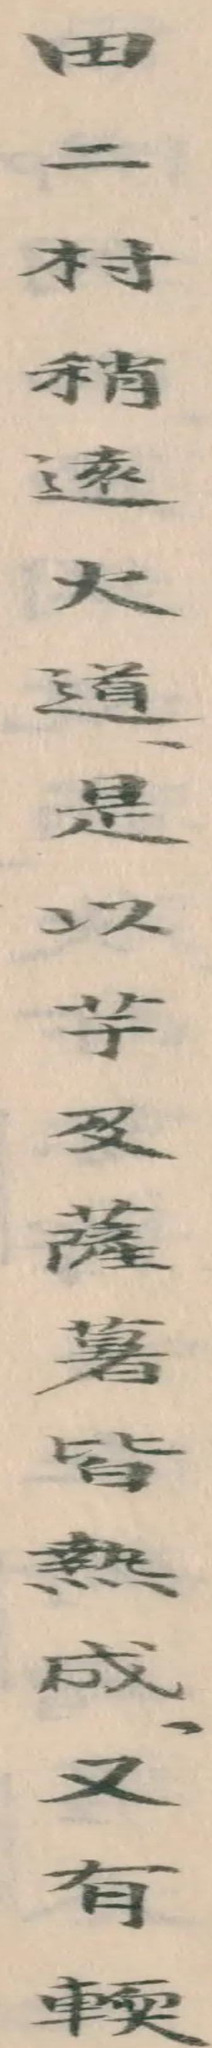田二村稍遠火道、是以芋及薩薯皆熱成、又有軟
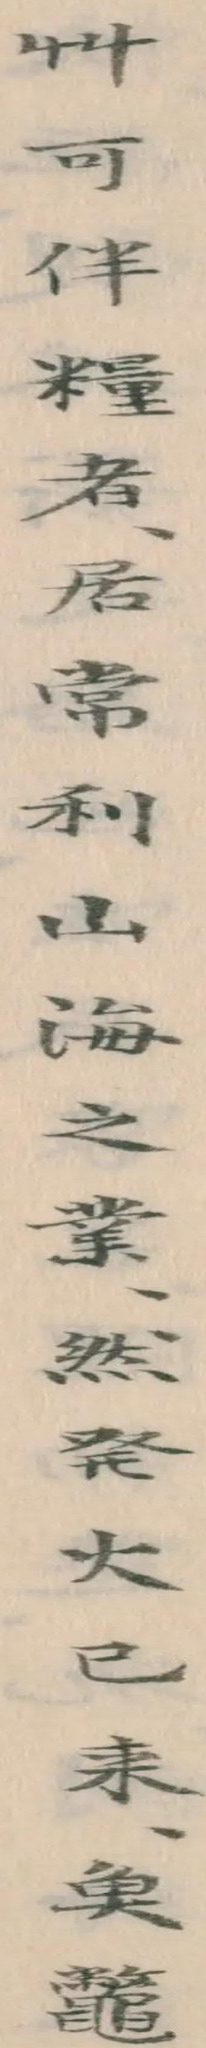艸可伴糧者、居常利山海之業、然発火已来、魚鼈
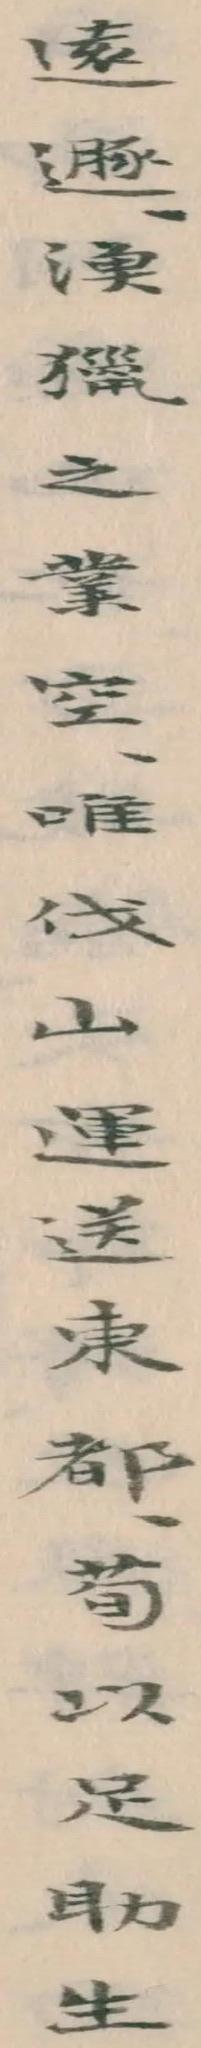遠遯、漁猟之業空、唯伐山運送東都、荀以足助生
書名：地災撮要. 巻11-12(地震之部)
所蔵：国立国会図書館 National Diet Library, JAPAN
